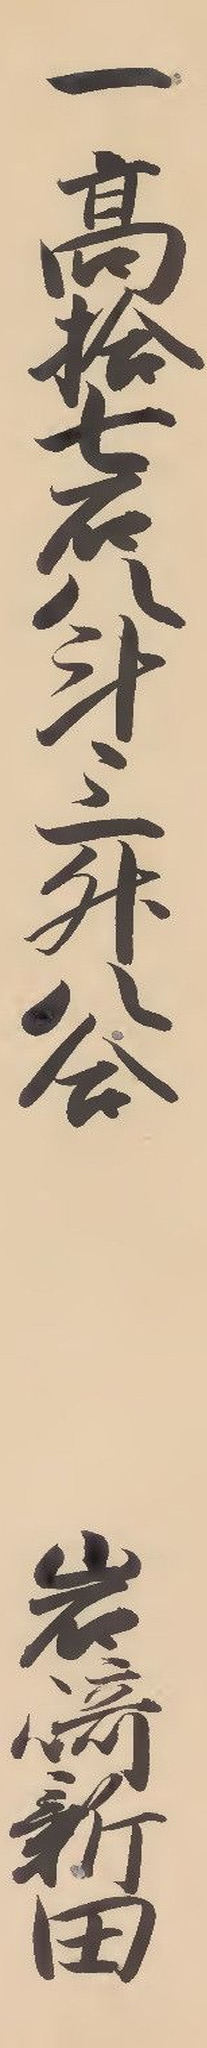一高拾七石八斗三升八合岩崎新田
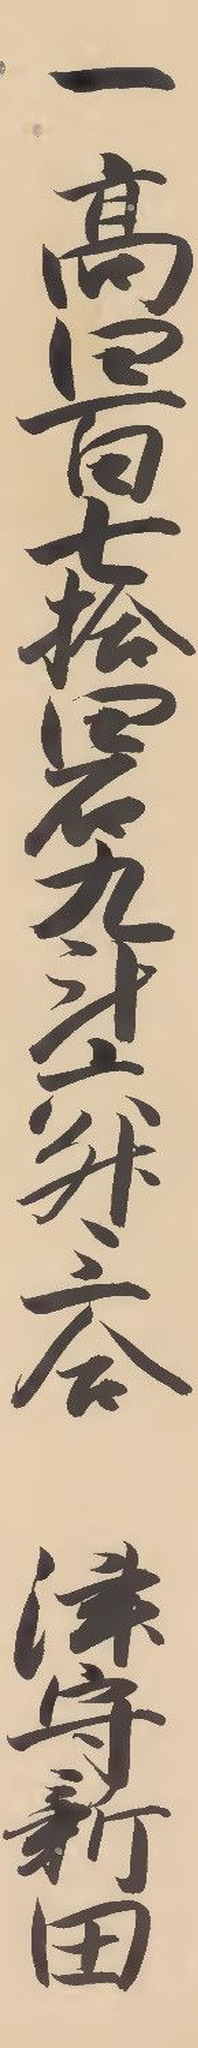一高四百七拾四石九斗六升三合津守新田
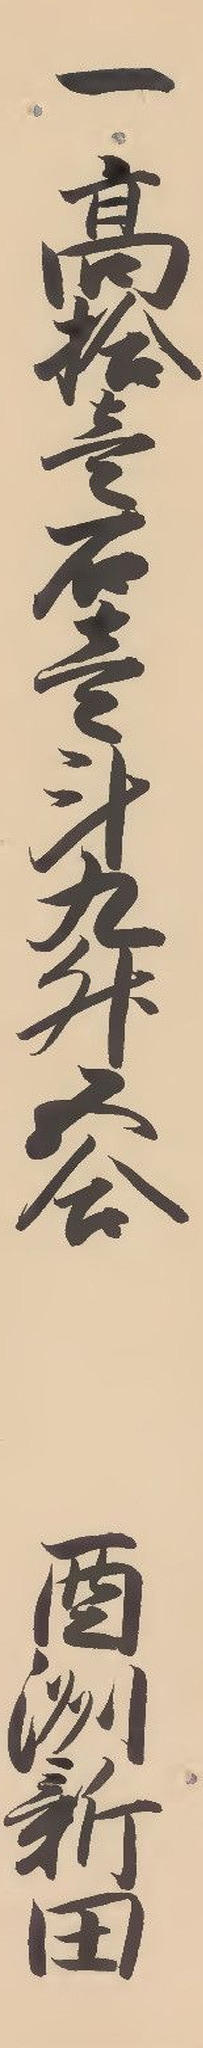一高拾壱石壱斗九升五合酉洲新田
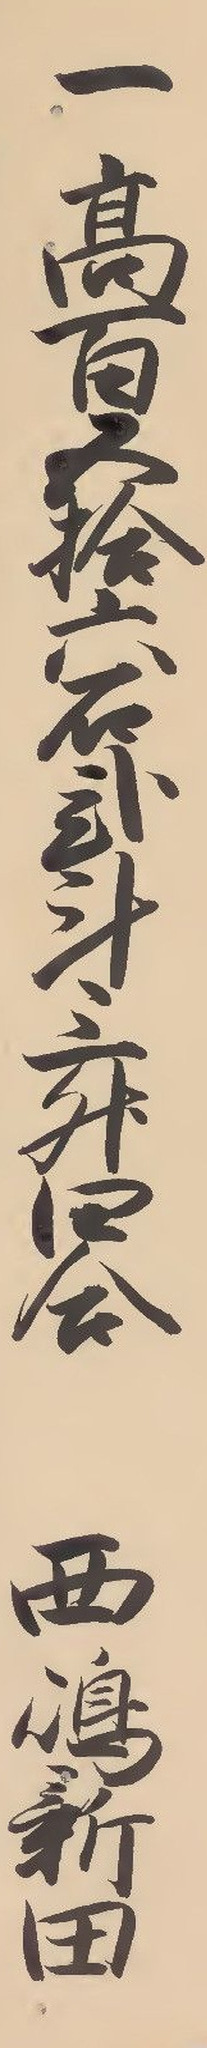一高百五拾六石弐斗三升四合西島新田
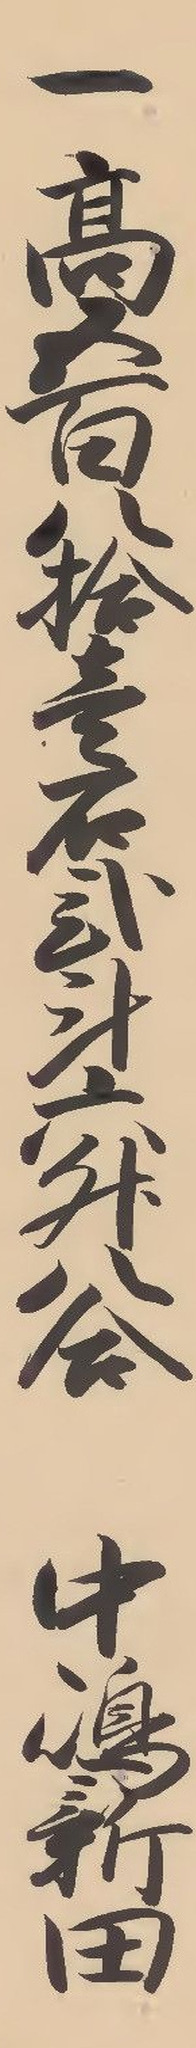一高五百八拾壱石弐斗六升八合中島新田
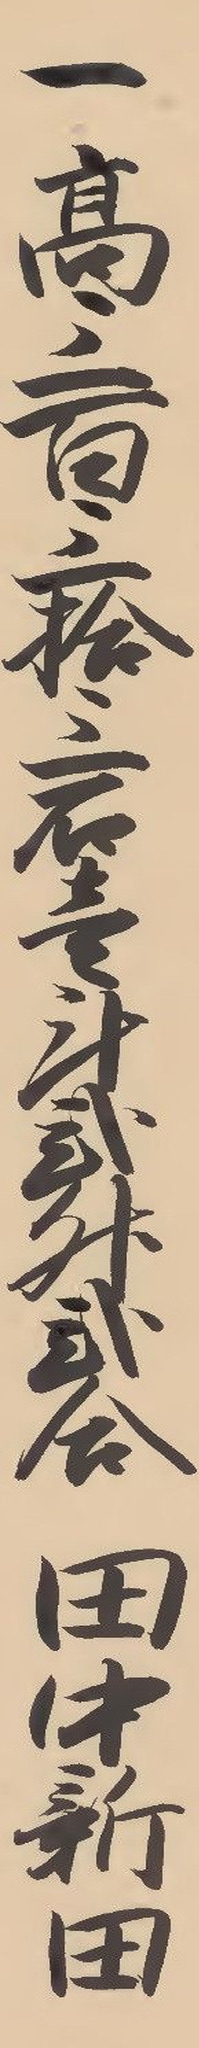一高三百三拾三石壱斗弐升弐合田中新田
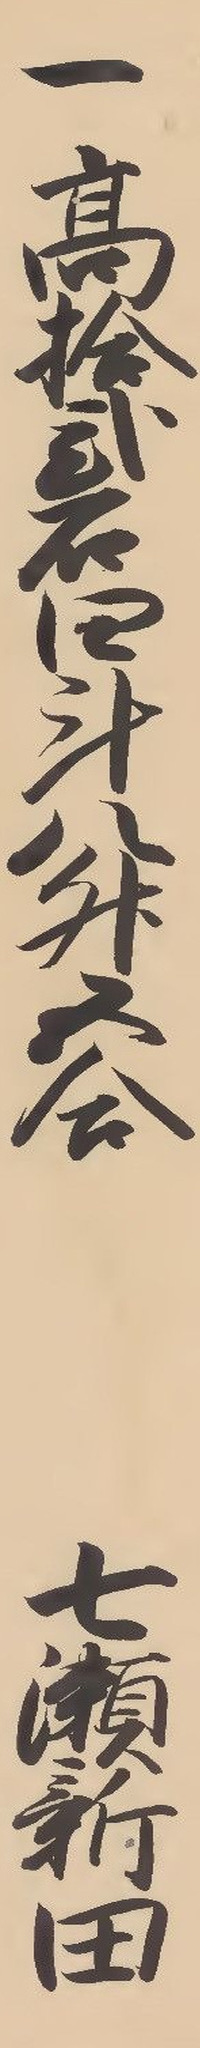一高拾弐石四斗八升五合七瀬新田
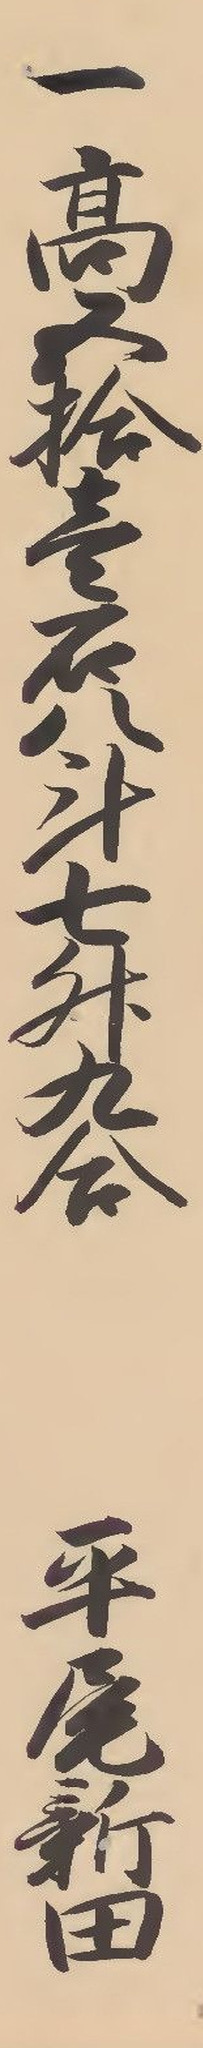一高五拾壱石八斗七升九合平尾新田

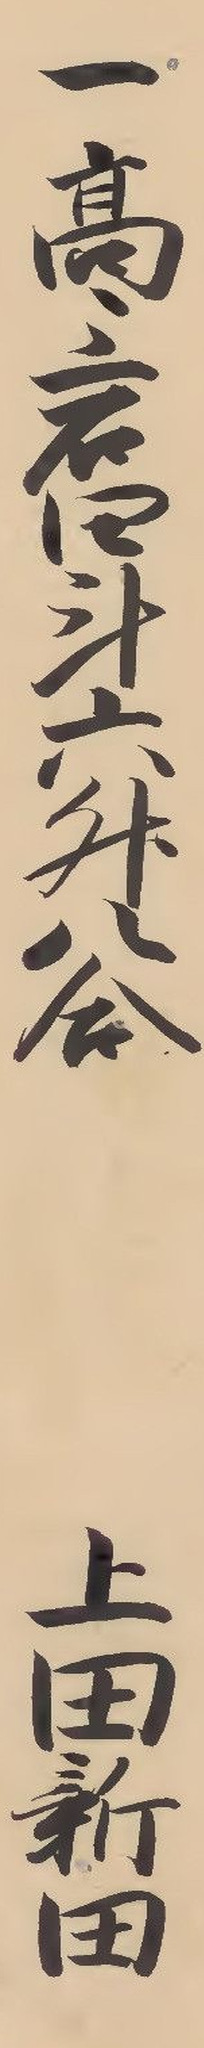一高三石四斗六升八合上田新田
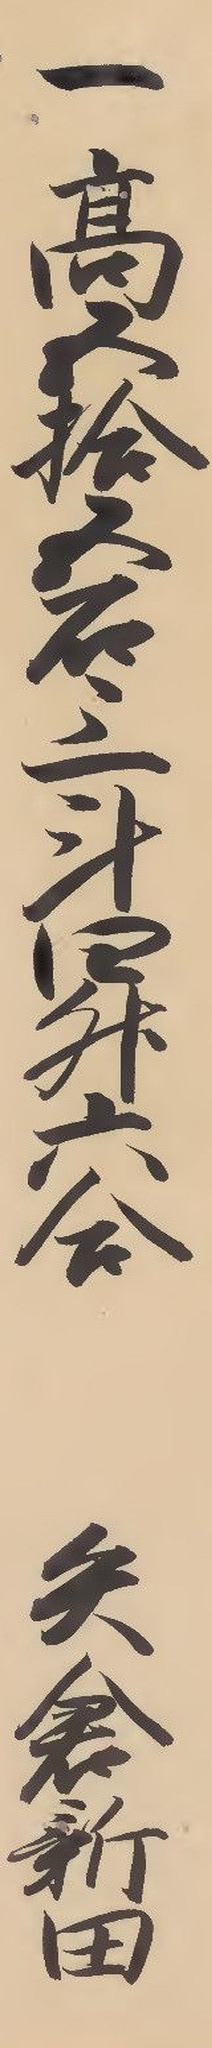一高五拾五石三斗四升六合矢倉新田
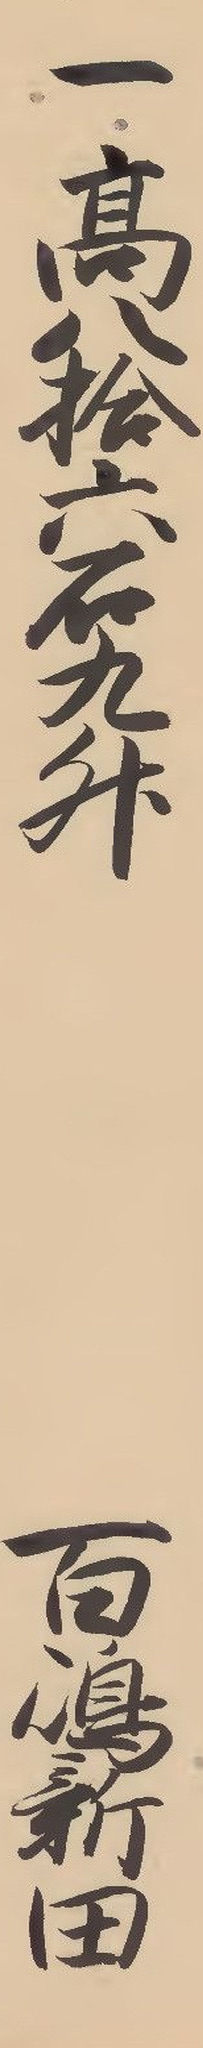一高八拾六石九升百島新田
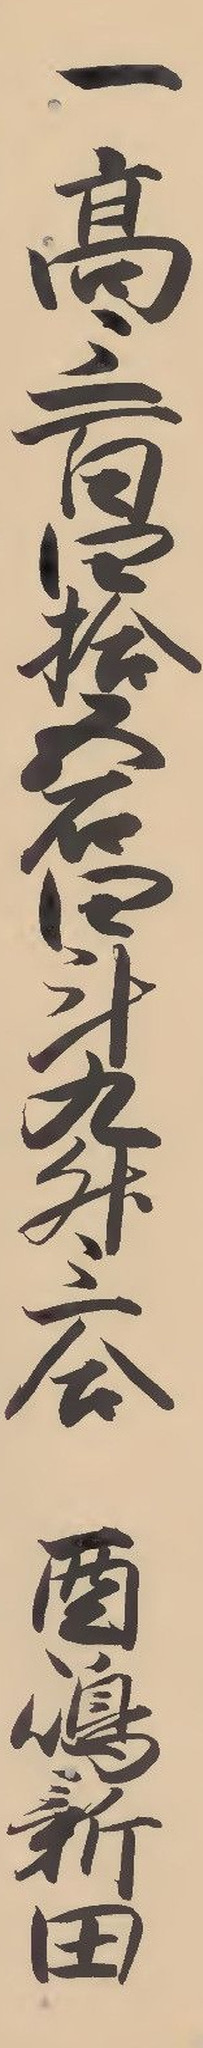一高三百四拾五石四斗九升三合酉島新田
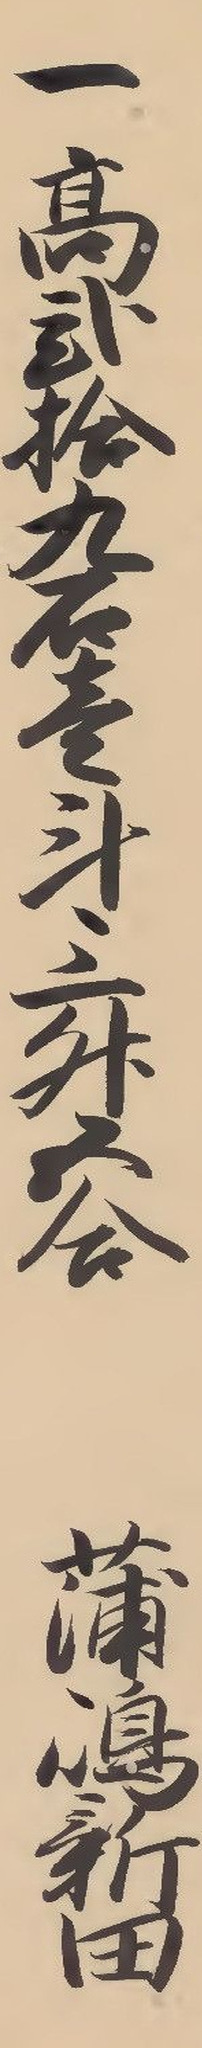一高弐拾九石壱斗三升五合蒲島新田
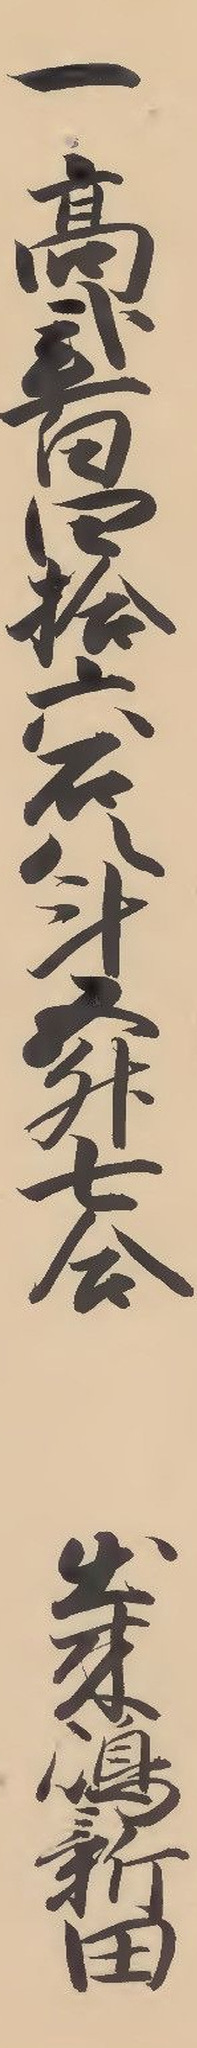一高弐百四拾六石八斗五升七合出来島新田
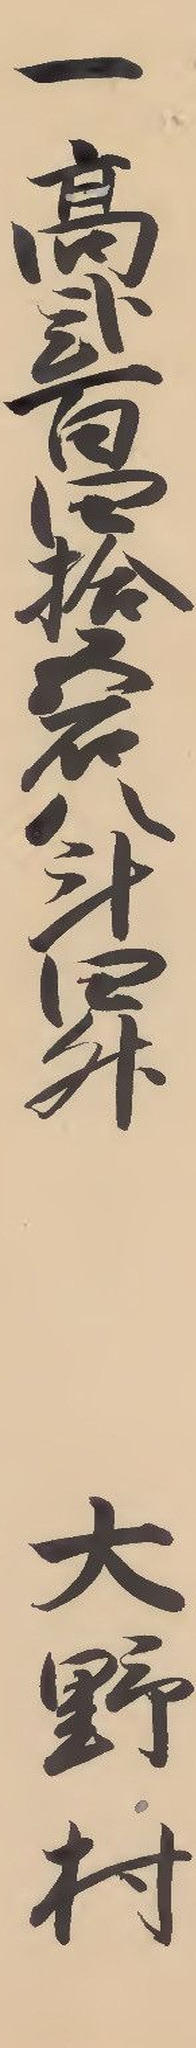一高弐百四拾五石八斗四升大野村
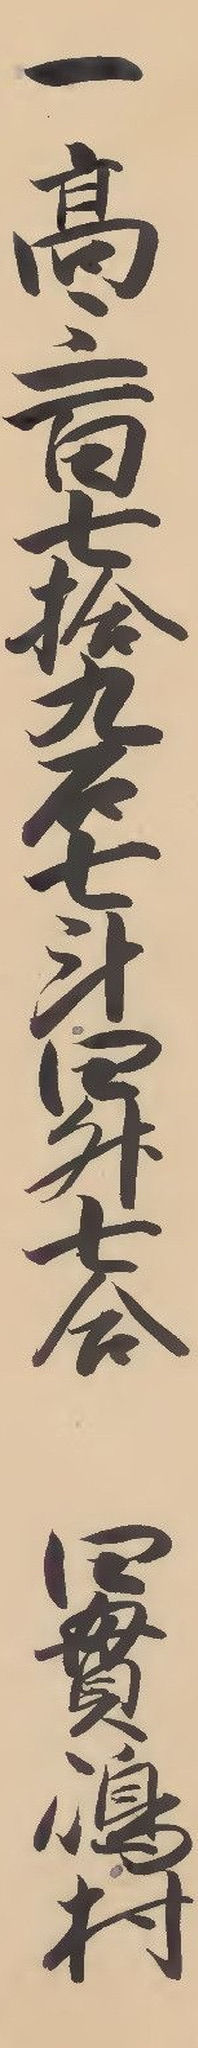一高三百七拾九石七斗四升七合四貫島村
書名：摂津国郷帳
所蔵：国立公文書館 National Archives of Japan
